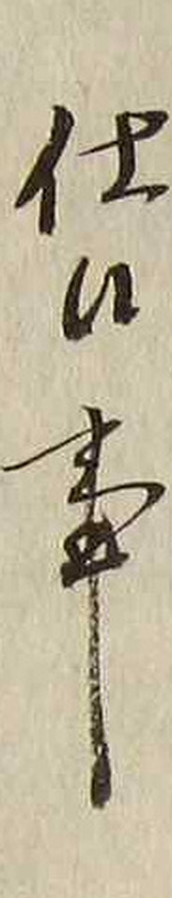仕候事
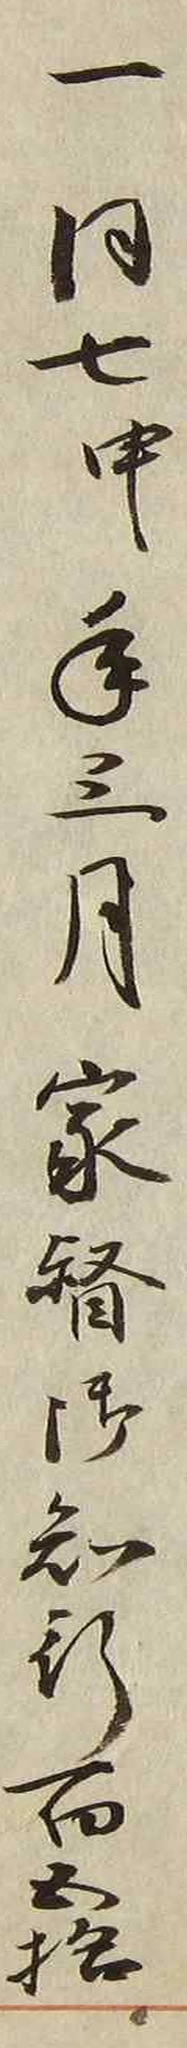一同七申年三月家督御知行百五拾
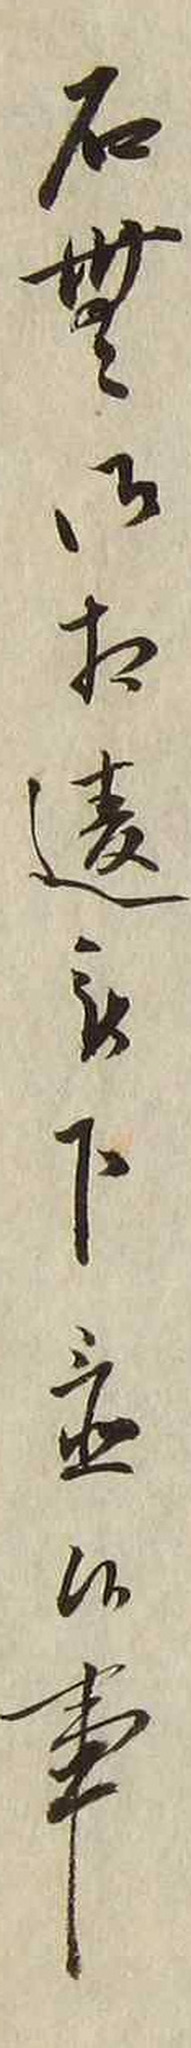石無御相違被下置候事

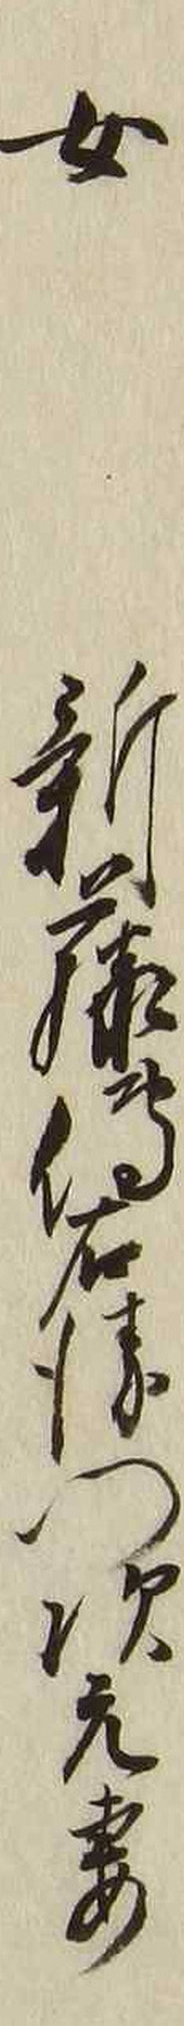女新藤伝右衛門次元妻
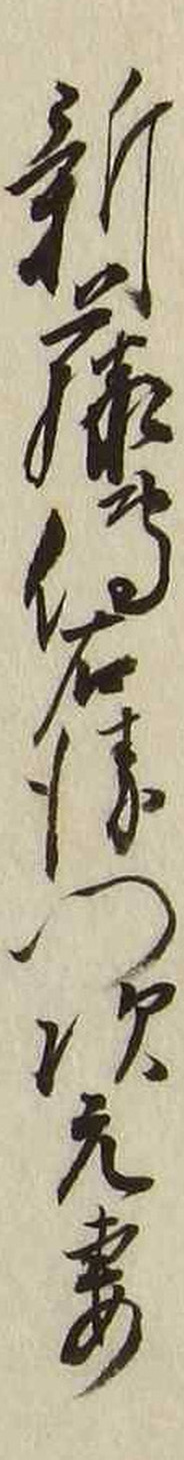女新藤伝右衛門次元妻
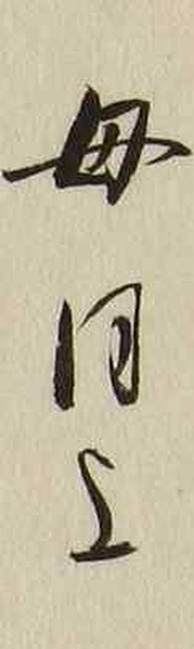母同上
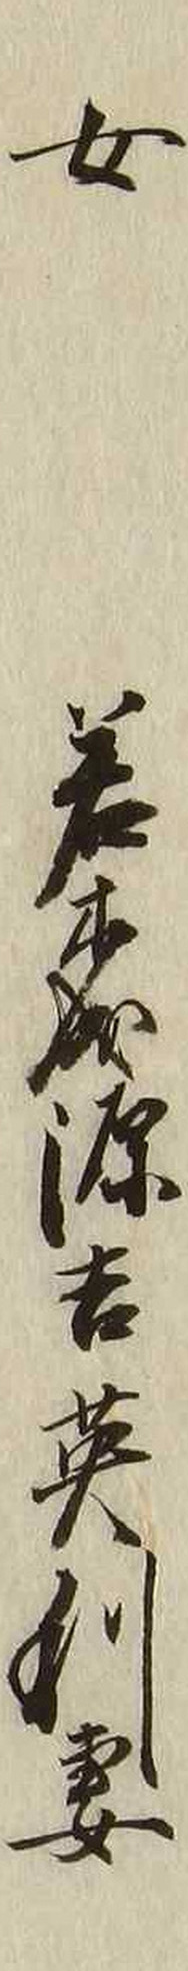女若森源吉英利妻
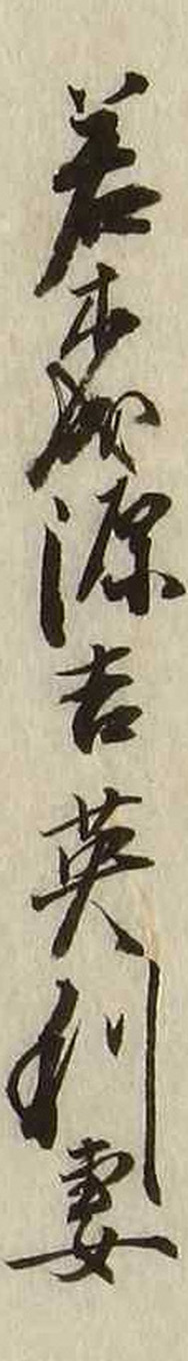女若森源吉英利妻
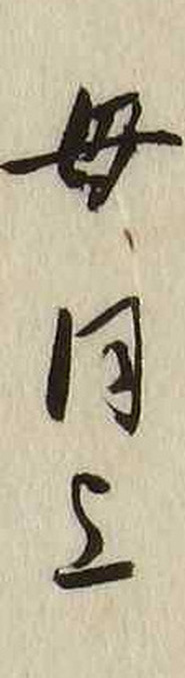母同上
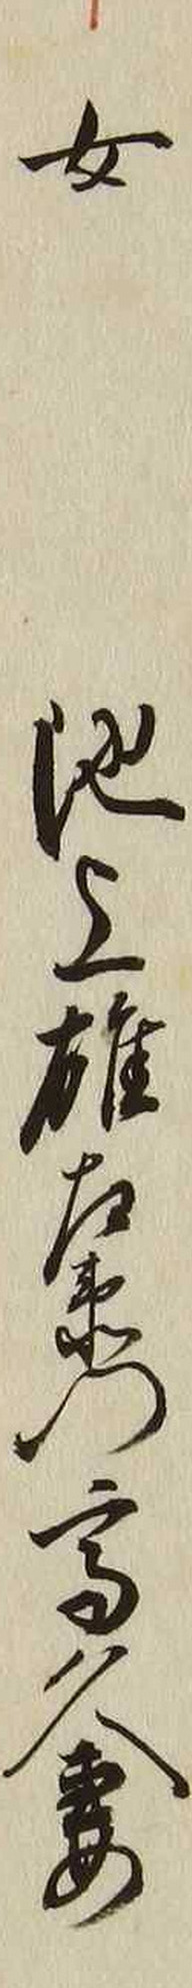女池上雄左衛門高久妻
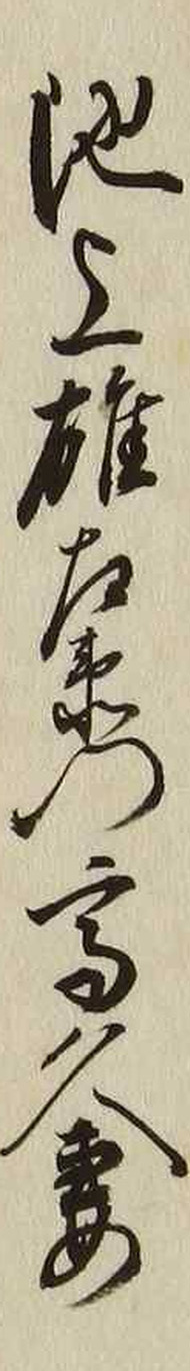女池上雄左衛門高久妻
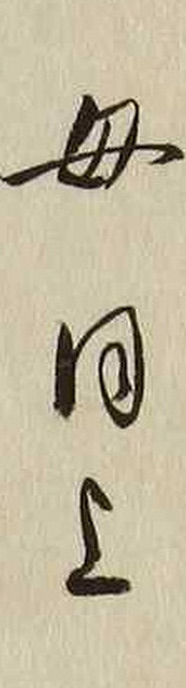母同上
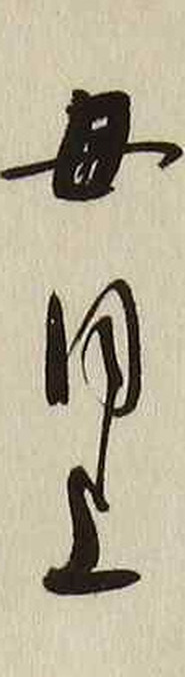母同上
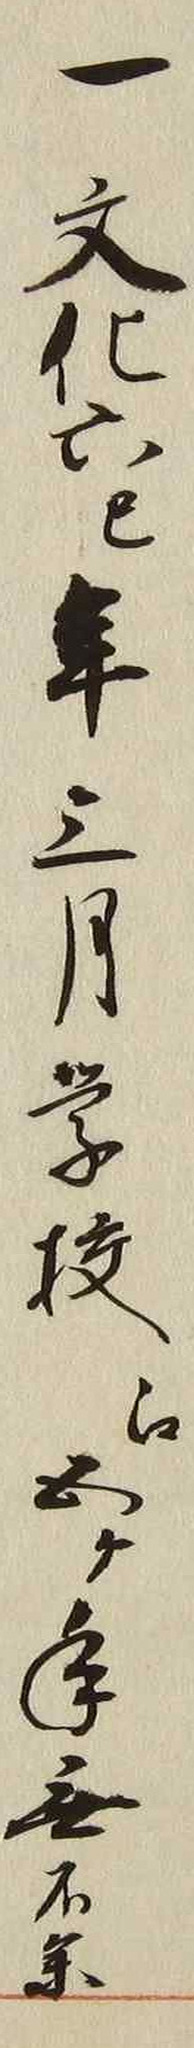一文化六巳年三月学校江五ケ年無不参
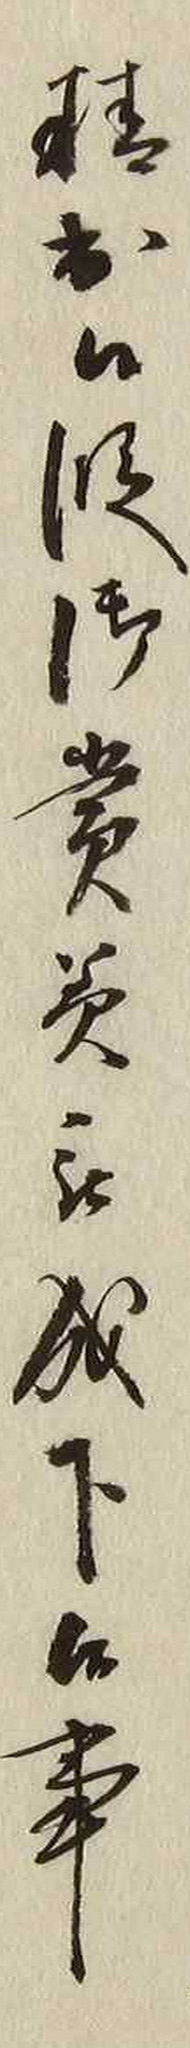精出候段御賞美被成下候事
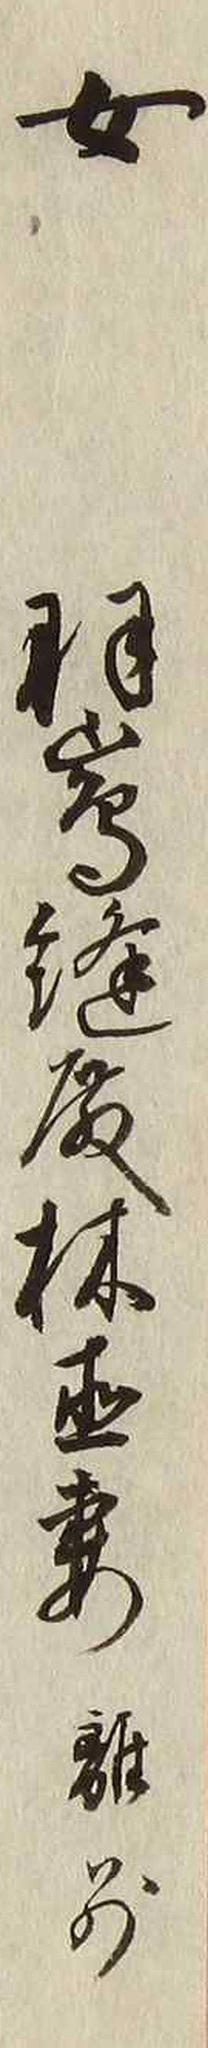女羽嶋縫殿林直妻離別
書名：諸士系譜　巻之22　い之部22
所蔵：会津若松市立会津図書館
